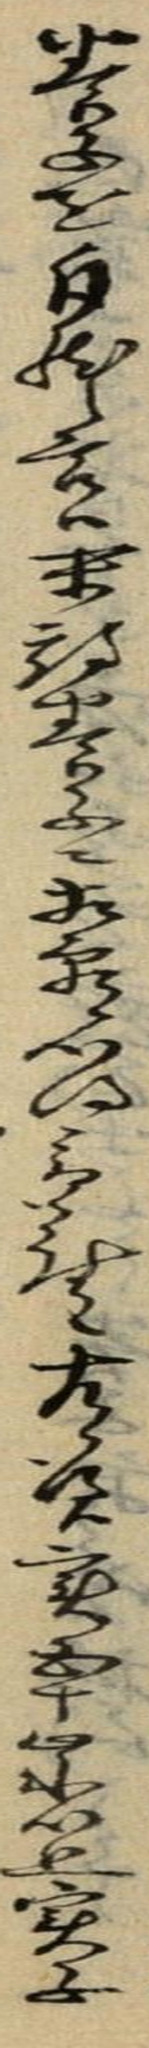養子を自然之節ハ末期養子ニ相願候様心得ニ而御座候左候得ハ実五十歳以上実子
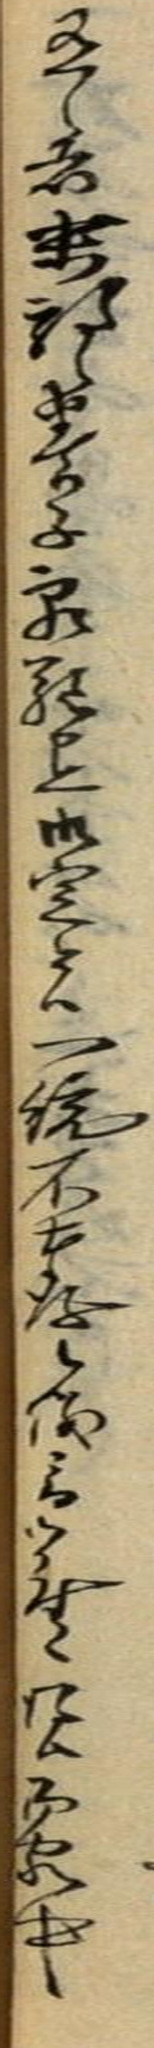有之者末期之養子願難申上御定とハ一統不奉存之儀二而御座候得ハ御家中
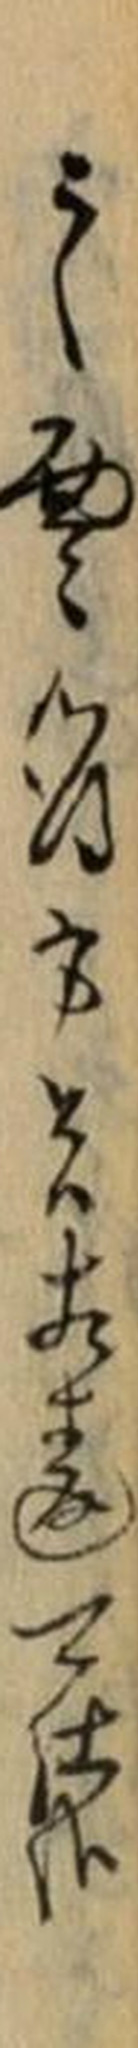之面々心得方とハ相違可仕哉
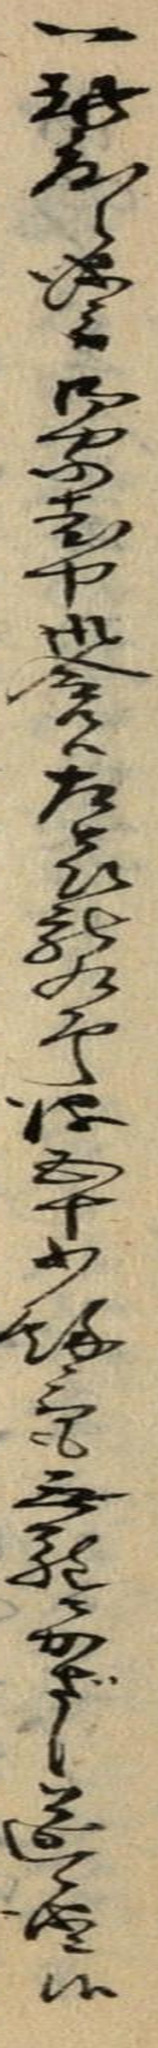一此度之儀ニ而御家老中御含ハたとひ新九郎儀五十少余ニ而も無難ニかざし遂候儀ニ候
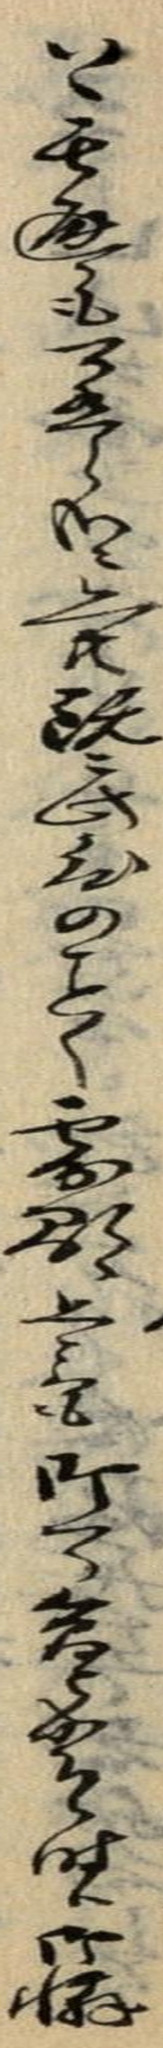ハヽ其通りも可有之哉ニ候へ共既ニ此度のことく露顕候上ニ而も御了簡被成下候時ハ御憐
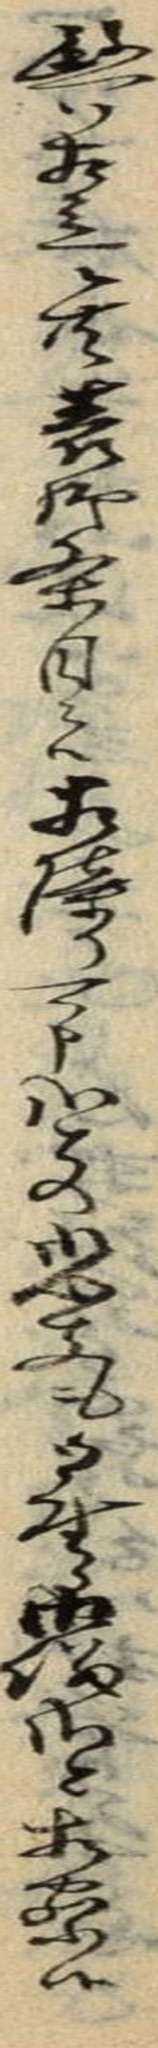愍ハ相立候共表御条目ニハ相障り可申哉との御心支も御座候御儀哉と相察候
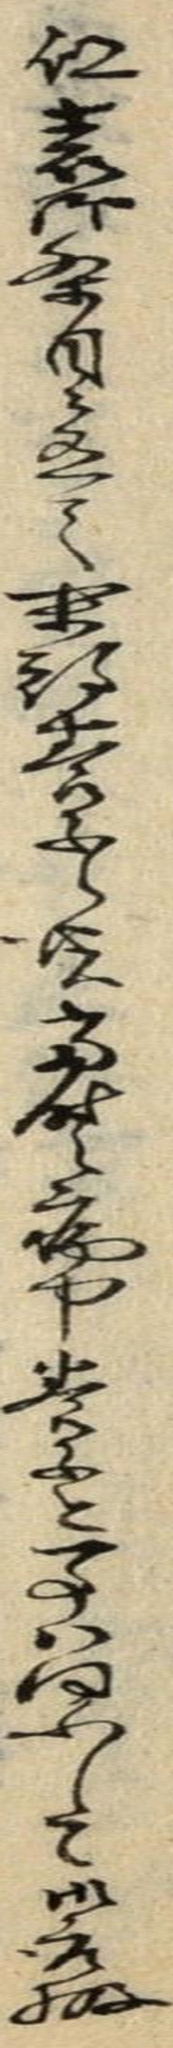但表御条目ニ有之末期養子之儀ハ当時之病中養子と事ハ同ふして御取扱
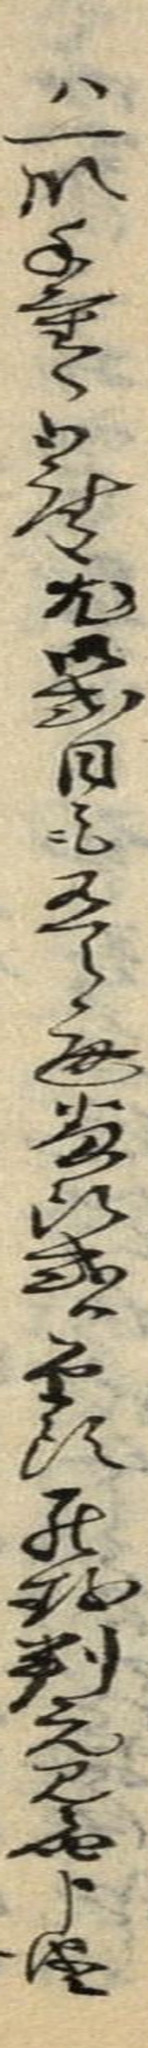ハ一段手重く御座候尤御式目ニも有之候通番頭或ハ筆頭罷越判元見届申儀ニ
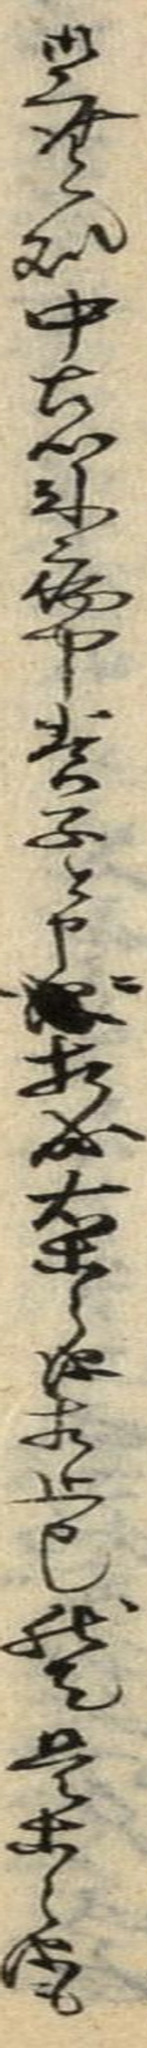御座候処中古以来病中養子と申ニ相成右等之儀相止申候然者是等之儀も
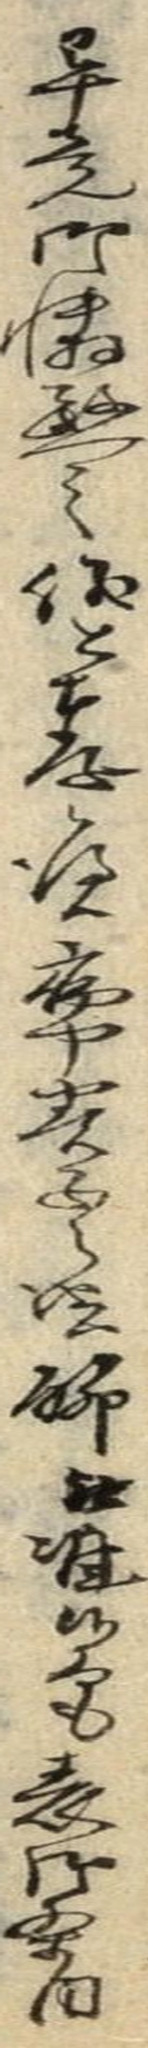畢竟御憐愍之儀と奉存候得ハ病中養子之儀ハ聊被准候而も表御条目
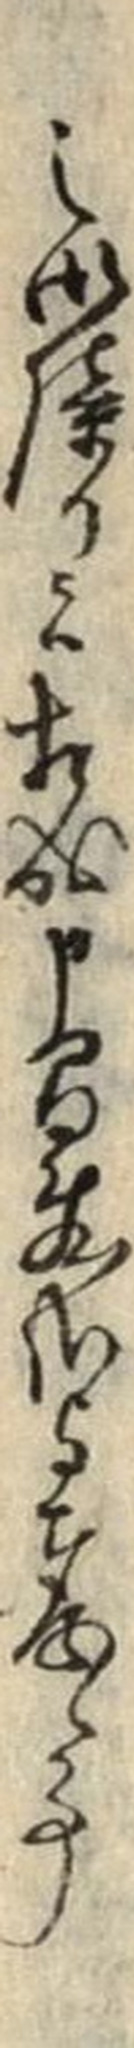之御障りニハ相成申間敷哉与奉存候事
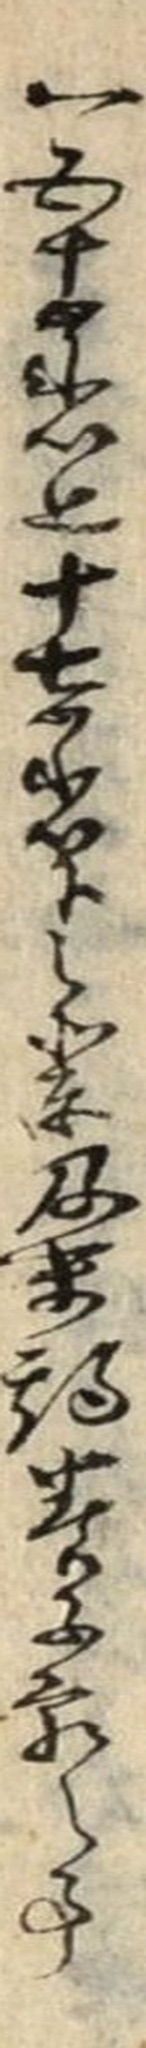一五十歳以上十七歳以下之輩及末期養子願之事
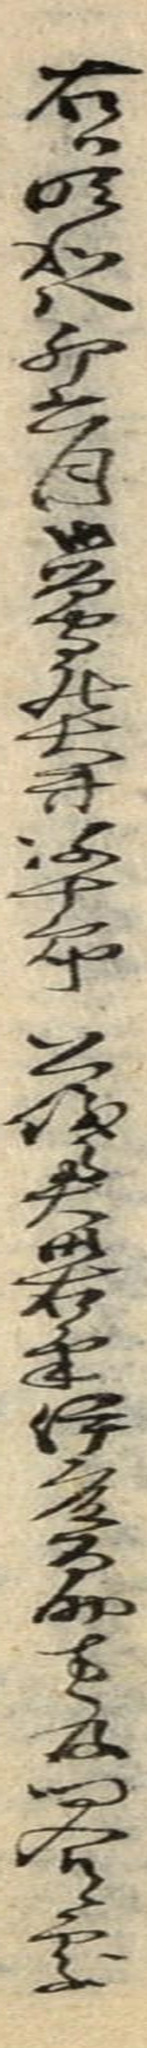右ハ明和八卯六月御留守居大井弥十郎公儀奥御右筆伊藤百助方へ及問合候処
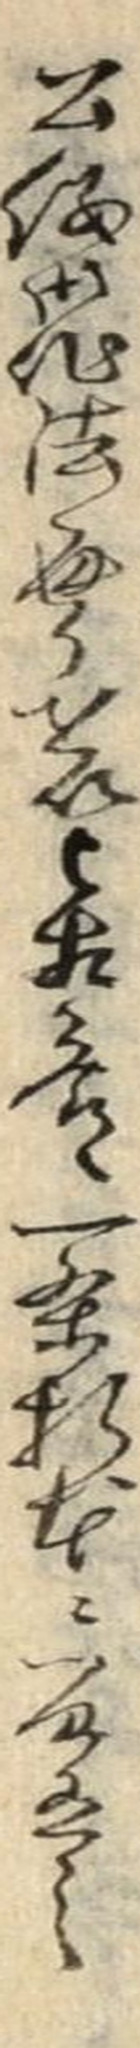公儀御作法通りを以被相答候一条折本ニ留有之
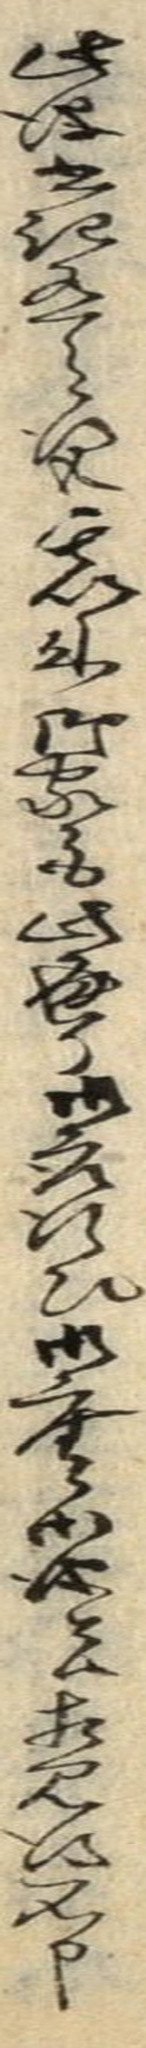此儀書記有之候得共其以来御家ニも此通り御取行ひ御座候御儀とハ相見得不申
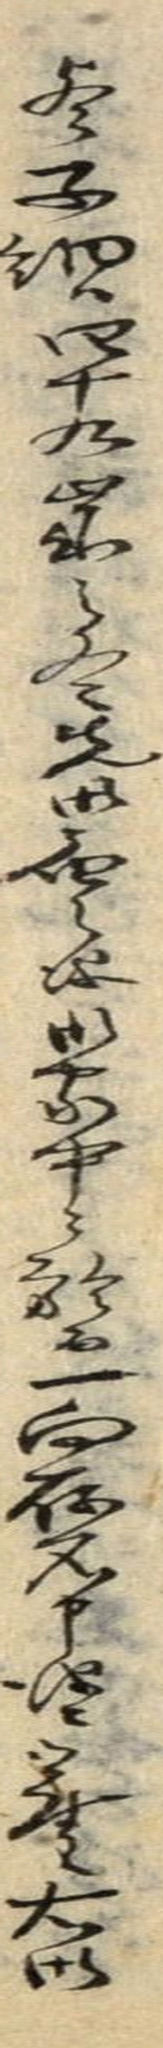歟子細ハ四十九歳之冬先御届之儀御家中ニ於而一向存不申儀ニ御座候右御
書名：養子縁組之部
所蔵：福井県文書館 Fukui Prefectural Archives
